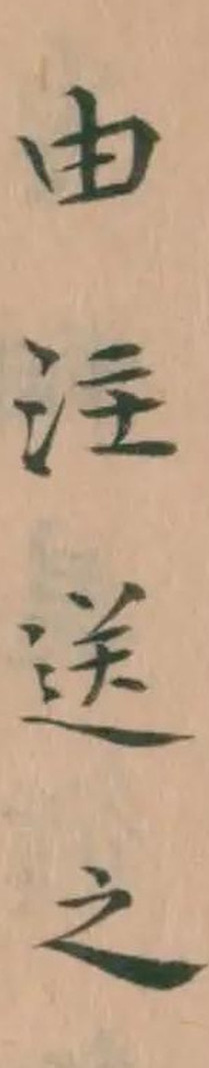由注送之
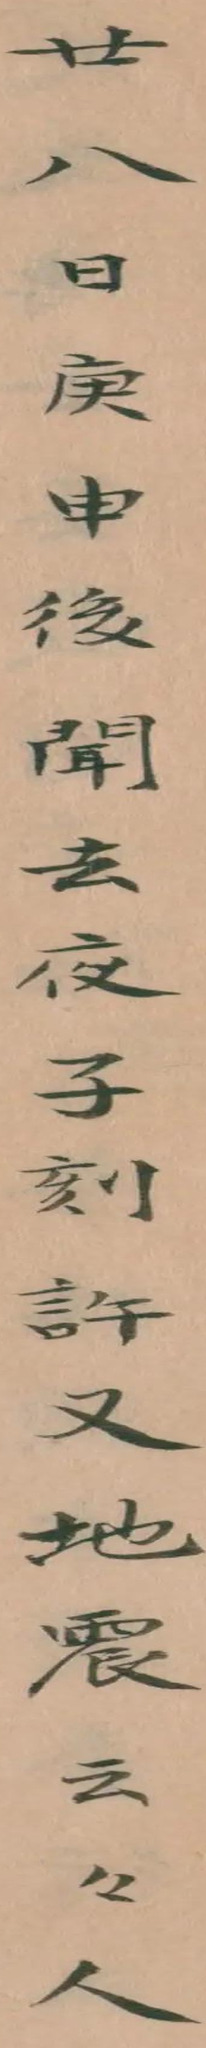廿八日庚申後聞去夜子刻許又地震云々人
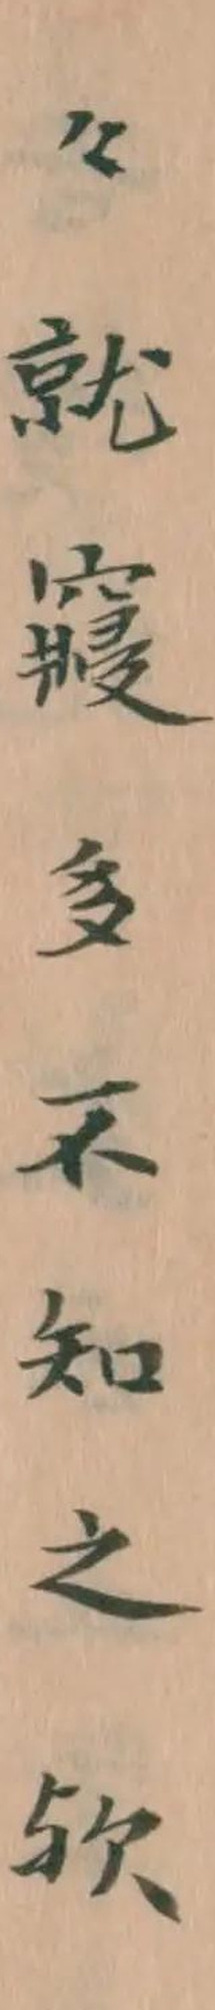々就寝多不知之歟
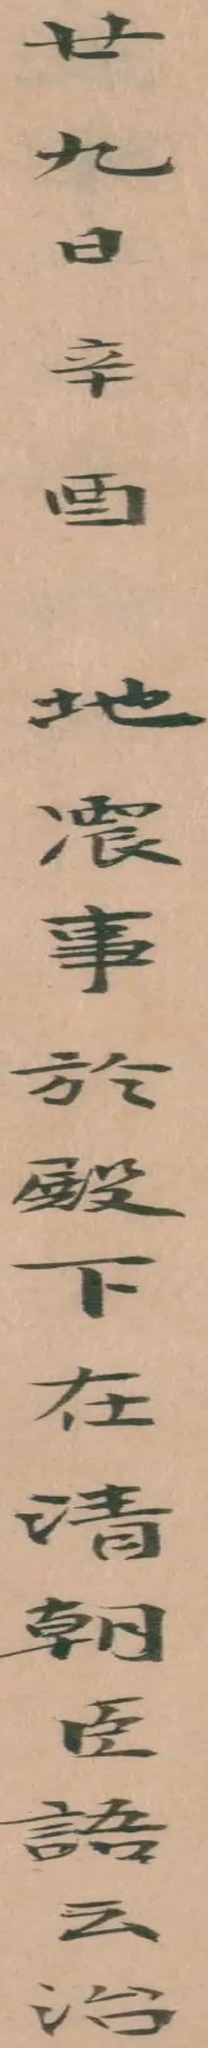廿九日辛酉地震事於殿下在清朝臣語云治
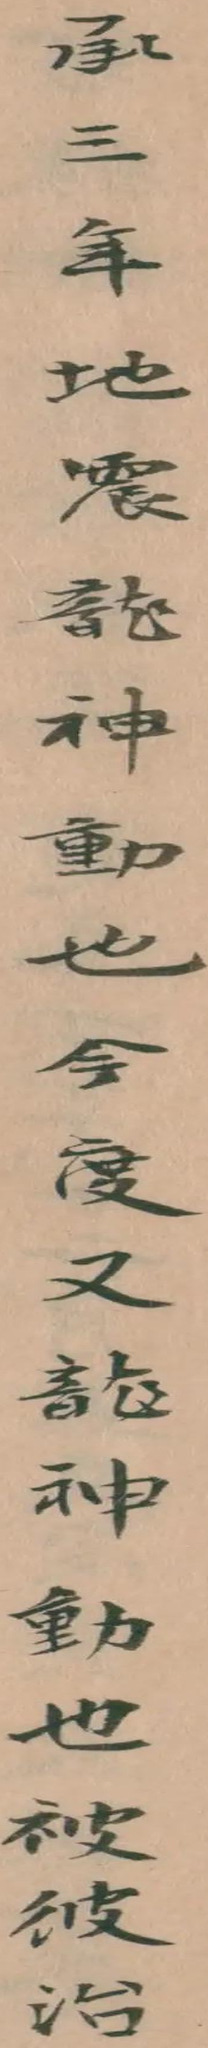承三年地震龍神動也今度又龍神動也被彼治
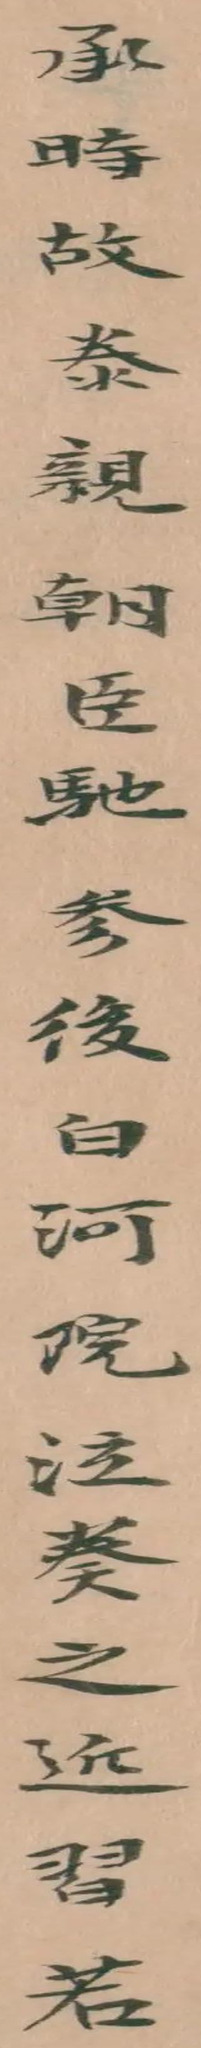承時故泰親朝臣馳参後白河院注奏之近習若
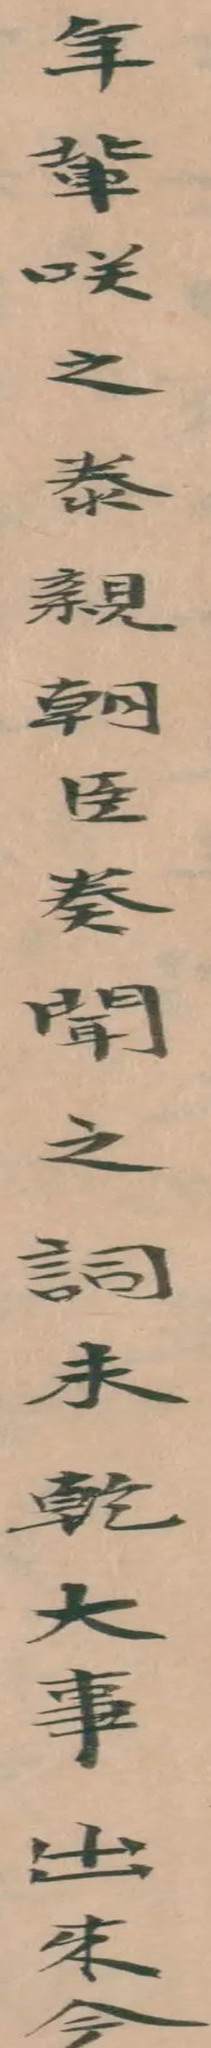年輩咲之泰親朝臣奏聞之詞未乾大事出来今
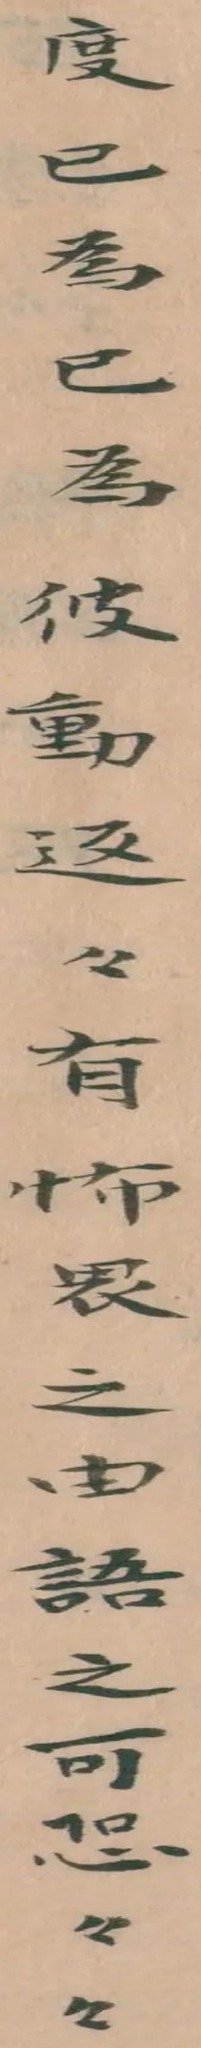度已為已為彼動返々有怖畏之由語之可恐々々

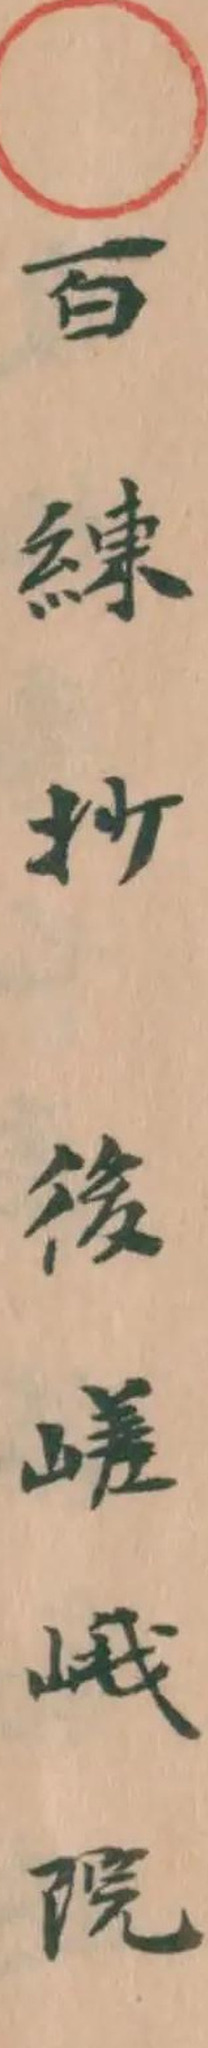○百練抄後嵯峨院
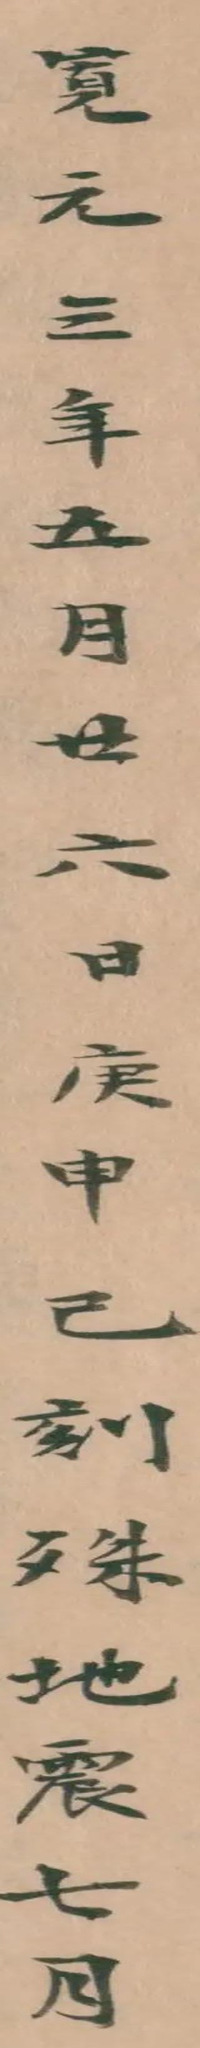寛元三年五月廿六日庚申巳刻殊地震七月
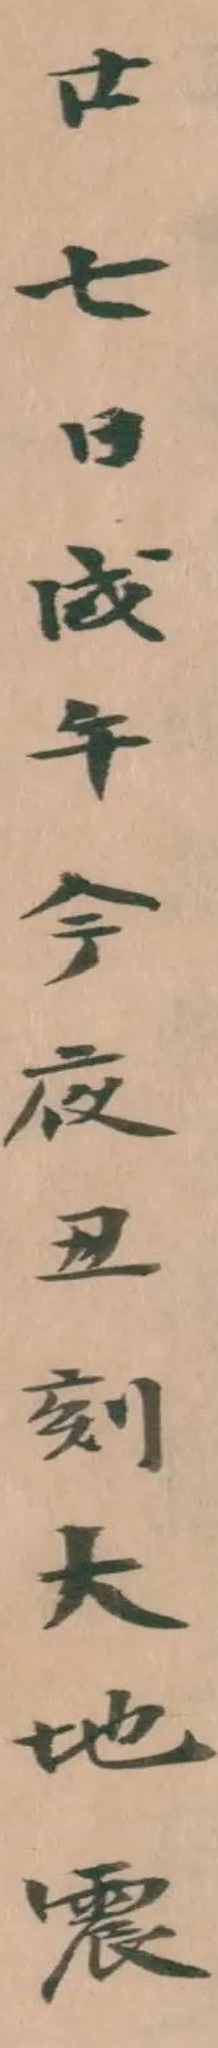廿七日戊午今夜丑刻大地震
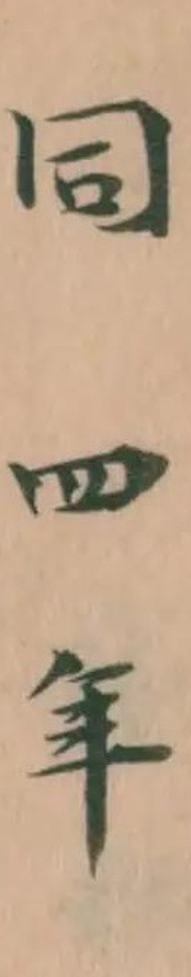同四年
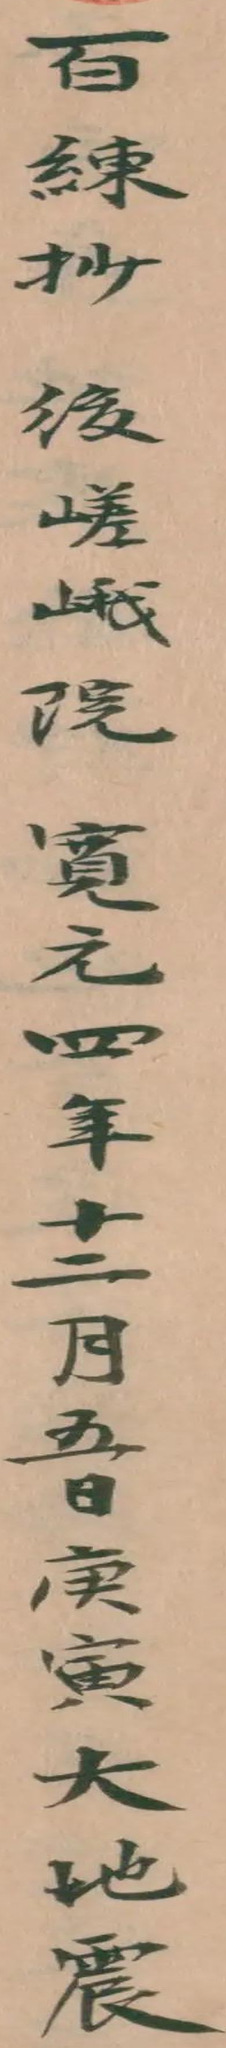○百練抄後嵯峨院寛元四年十二月五日庚寅大地震
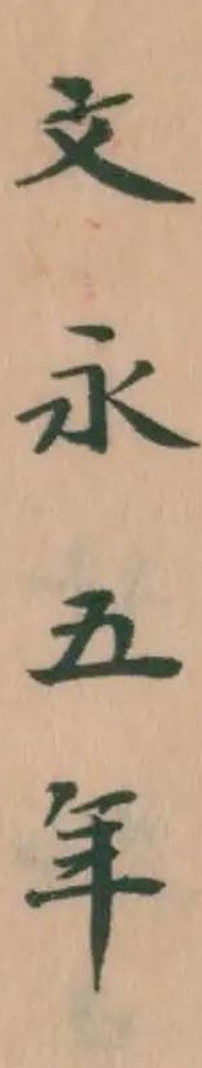文永五年
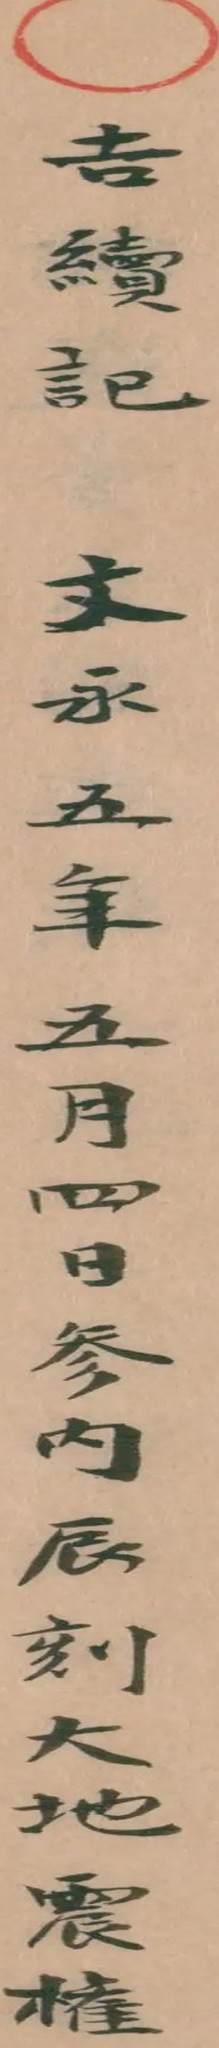○𠮷続記文永五年五月四日参内辰刻大地震権
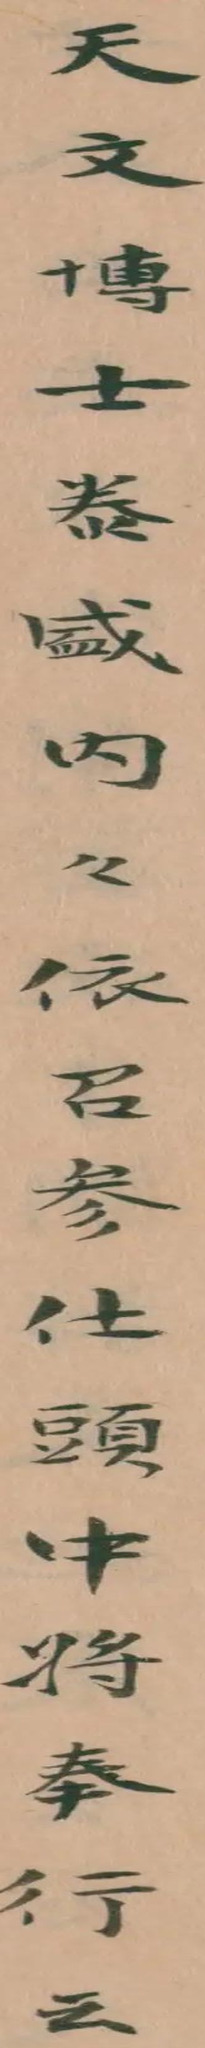天文博士泰盛内々依召参仕頭中将奉行云
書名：地災撮要. 巻5-6(地震之部)
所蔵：国立国会図書館 National Diet Library, JAPAN
